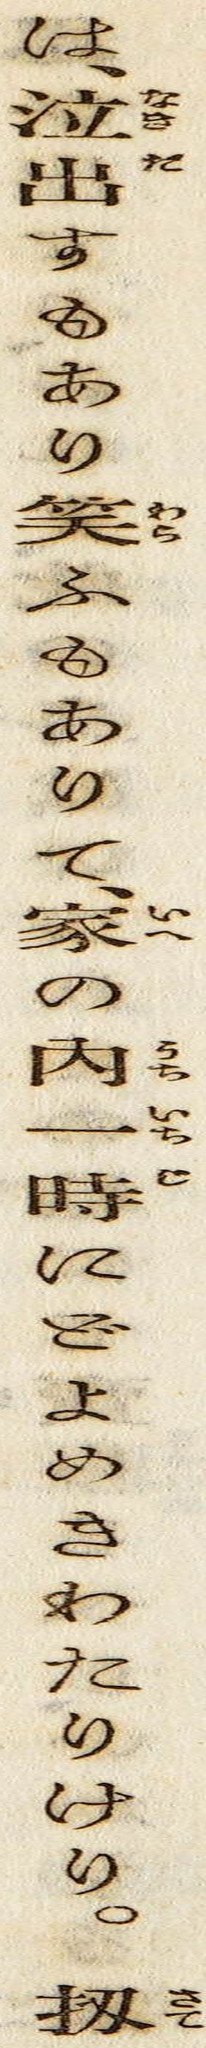は、泣出すもあり笑ふもありて、家の内一時にどよめきわたりけり。扨
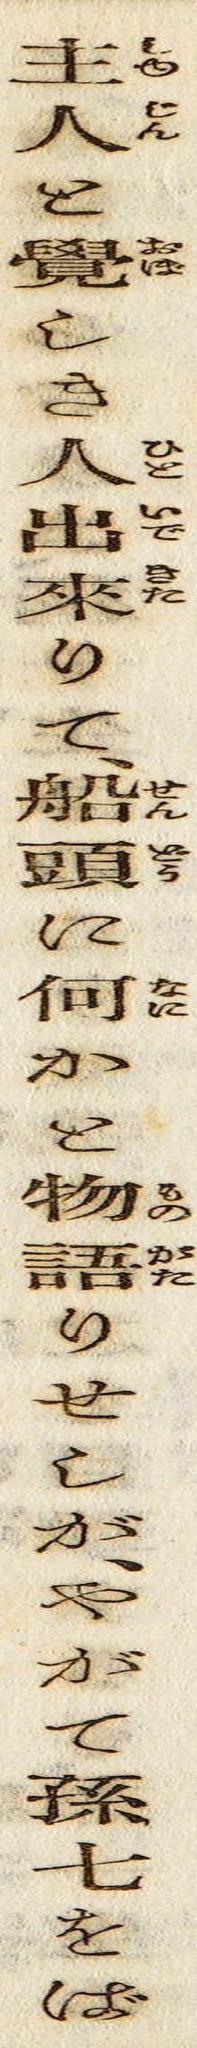主人と覚しき人出来りて、船頭に何かと物語りせしが、やがて孫七をば
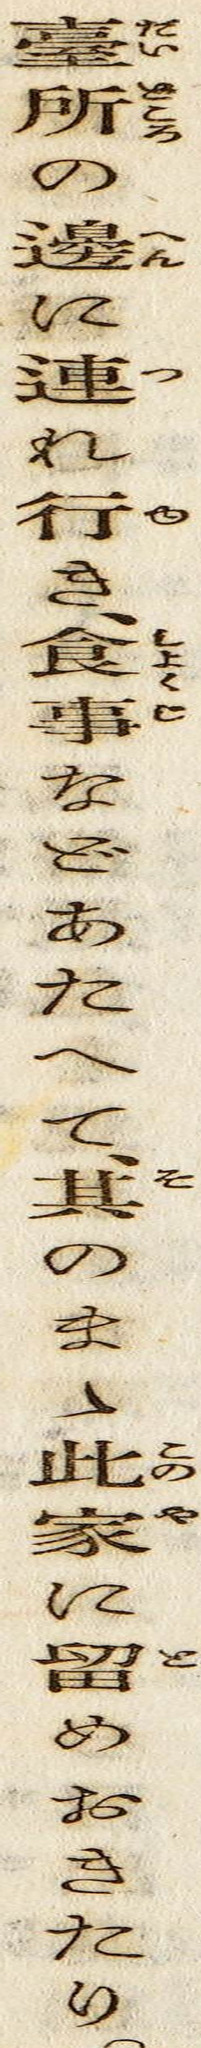台所の辺に連れ行き、食事などあたへて、其のまゝ此家に留めおきたり。
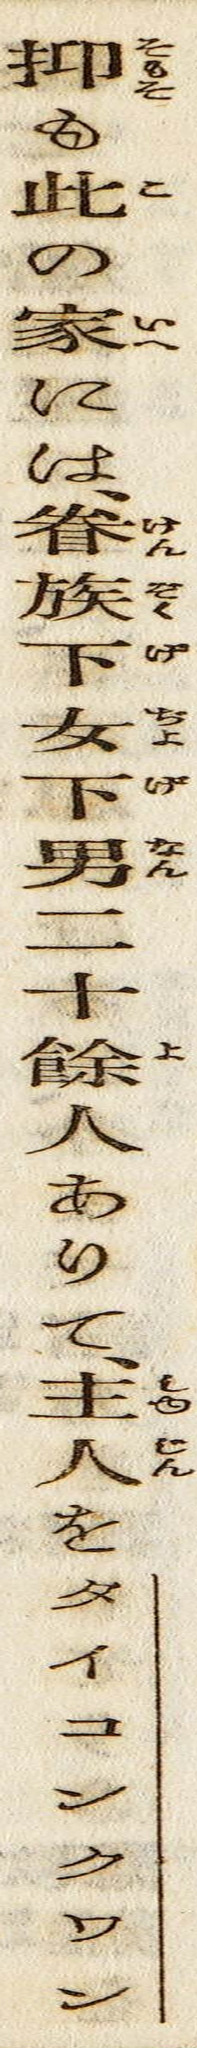抑も此の家には、眷族下女下男二十余人ありて、主人をタイコンクワン
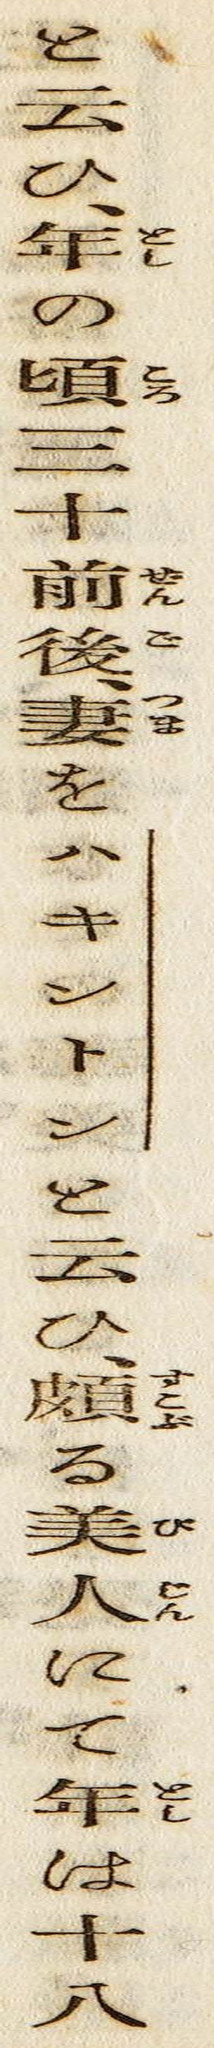と云ひ、年の頃三十前後、妻をハキントンと云ひ、頗る美人にて年は十八
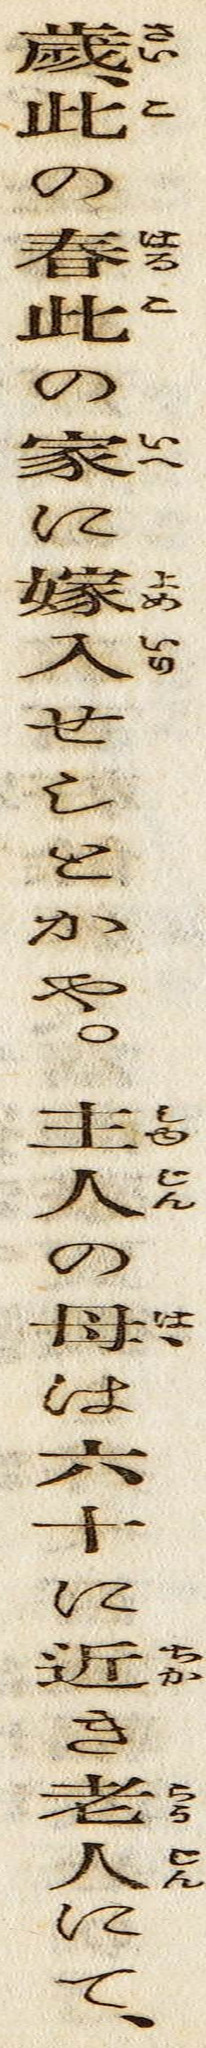歳、此の春此の家に嫁入せしとかや。主人の母は六十に近き老人にて、
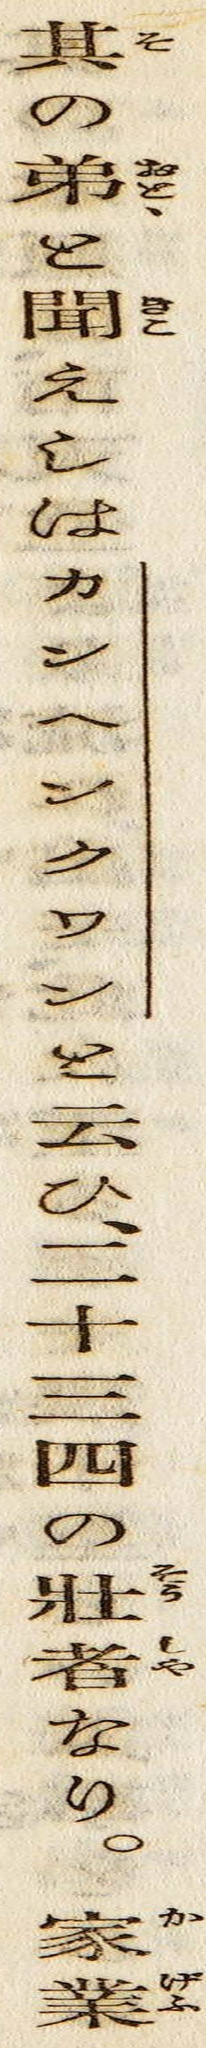其の弟と聞えしはカンヘンクワンと云ひ、二十三四の壮者なり。家業
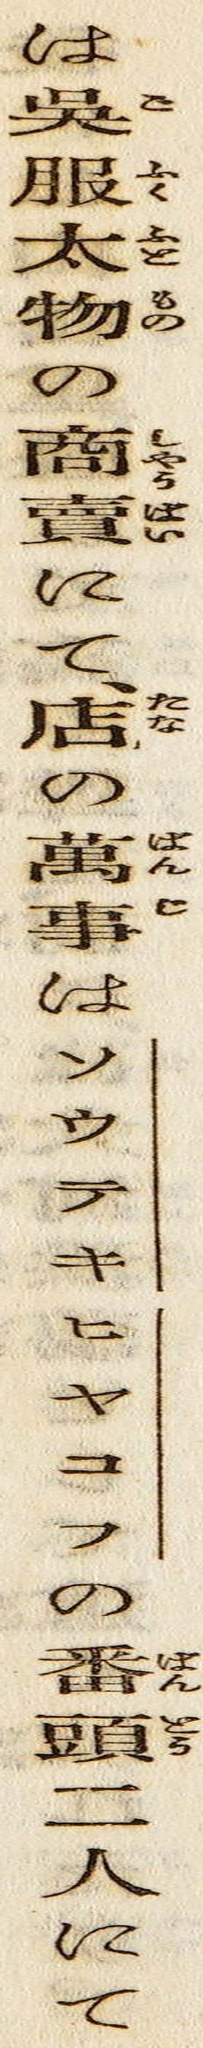は呉服太物の商売にて、店の万事はソウテキヒヤコフの番頭二人にて
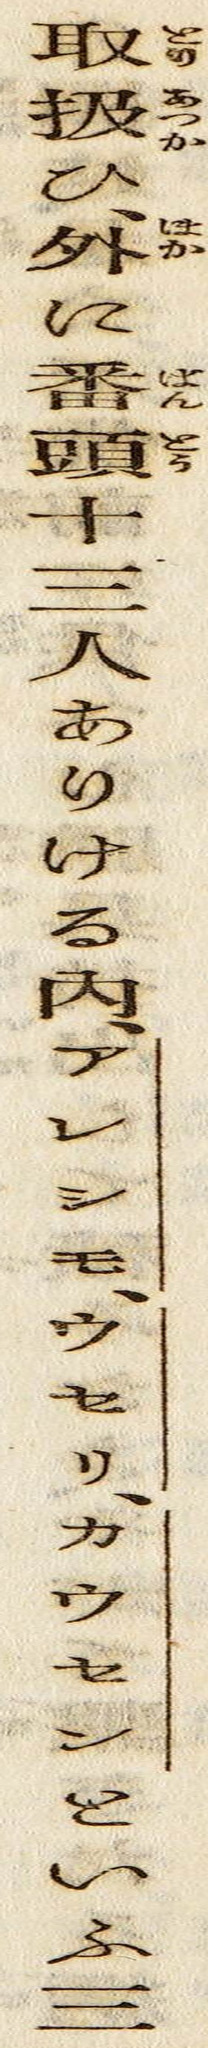取扱ひ、外に番頭十三人ありける内、アレシモ、ウセリ、カウセンといふ三
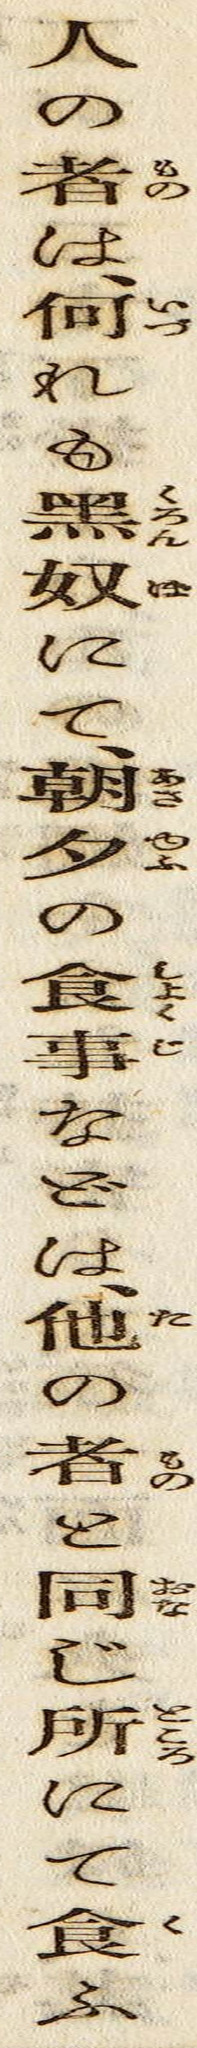人の者は、何れも黒奴にて、朝夕の食事などは、他の者と同じ所にて食ふ
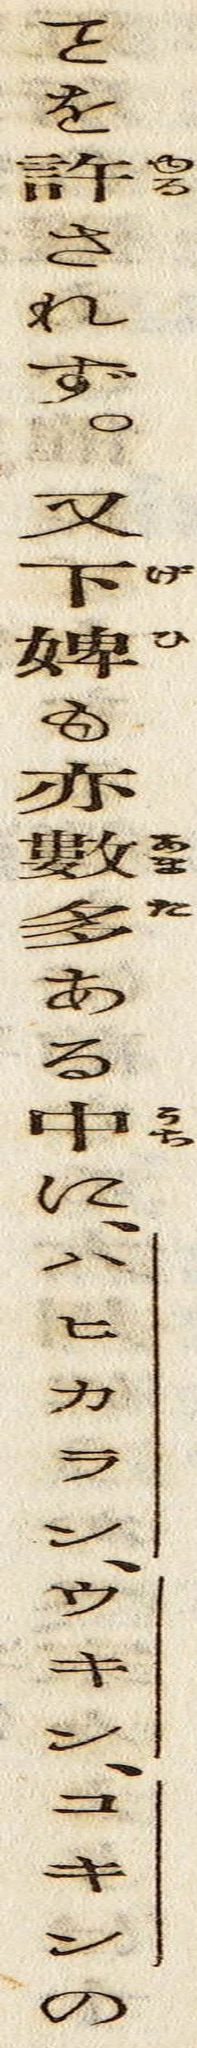ことを許されず。又下婢も亦数多ある中に、ハヒカラン、ウキン、コキンの
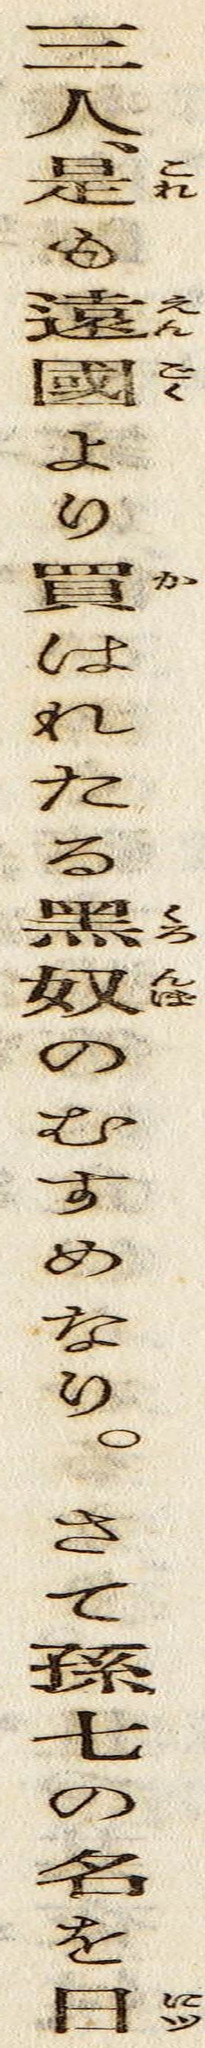三人、是も遠国より買はれたる黒奴のむすめなり。さて孫七の名を日
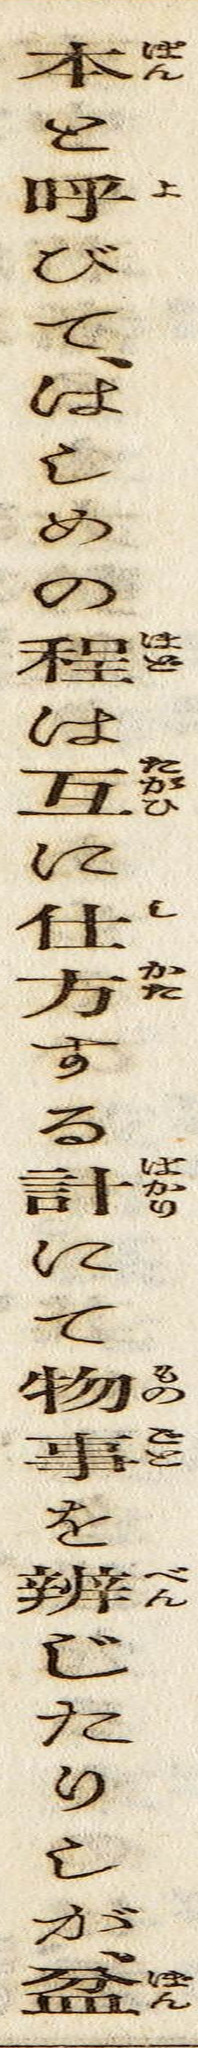本と呼びて、はしめの程は互に仕形する計にて物事を弁じたりしが、盆
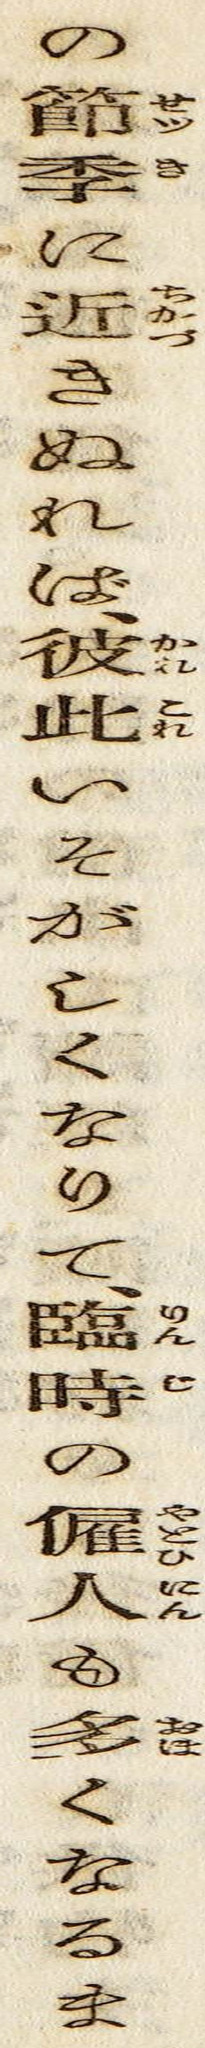の節季に近きぬれば、彼此いそがしくなりて、臨時の雇人も多くなるま
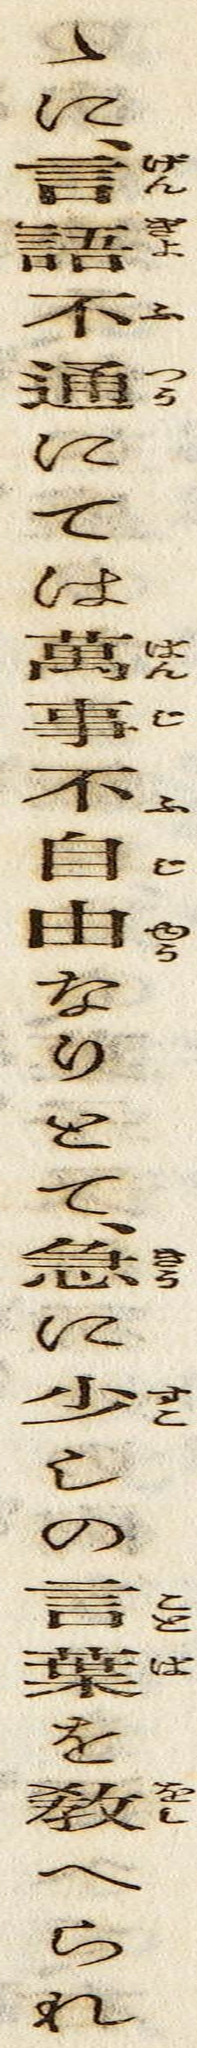ゝに、言語不通にては万事不自由なりとて、急に少しの言葉を教へられ
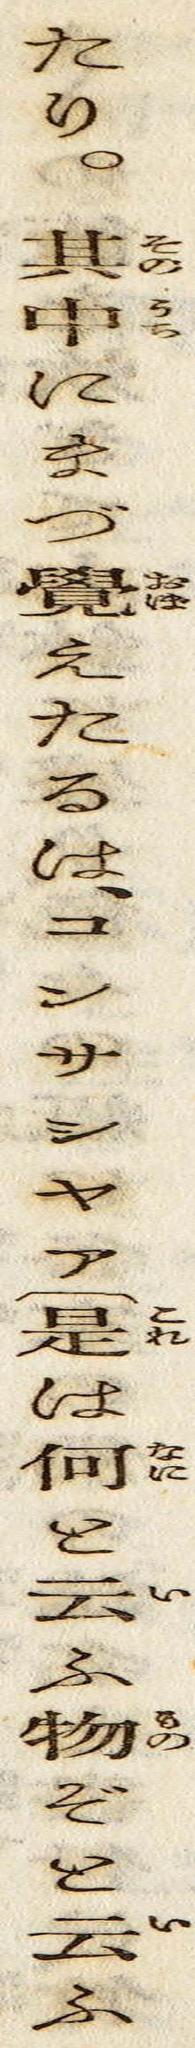たり。其中にまづ覚えたるは、コンサシヤア[是は何と云ふ物ぞと云ふ
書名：日本漂流譚
